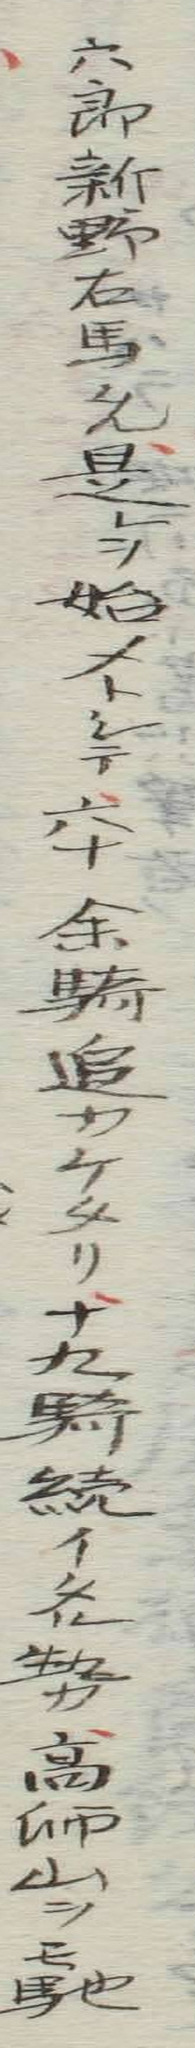六郎新野右馬允、是レヲ始メトシテ六十余騎追カケタリ、十九騎続イタル勢、高師山ヲモ馳
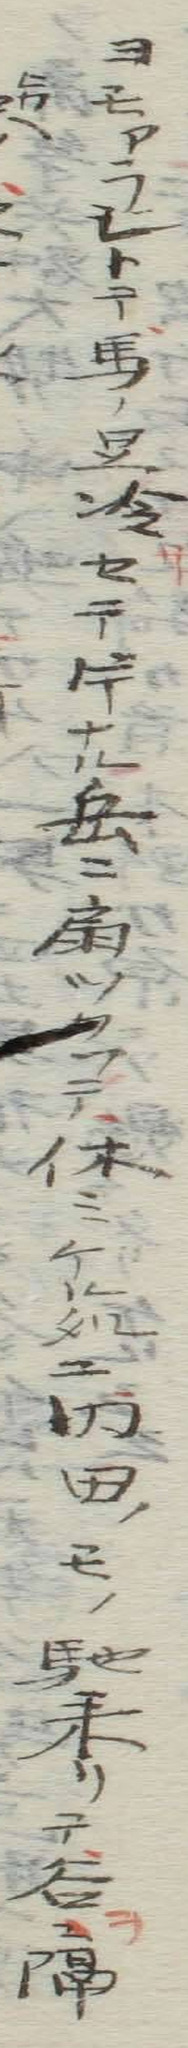ヨモアラジトテ、馬ノ足冷サセテ片ナル岳ニ扇ツカフテ、休ミケル処ニ内田モノ馳来リテ、谷ヲ隔
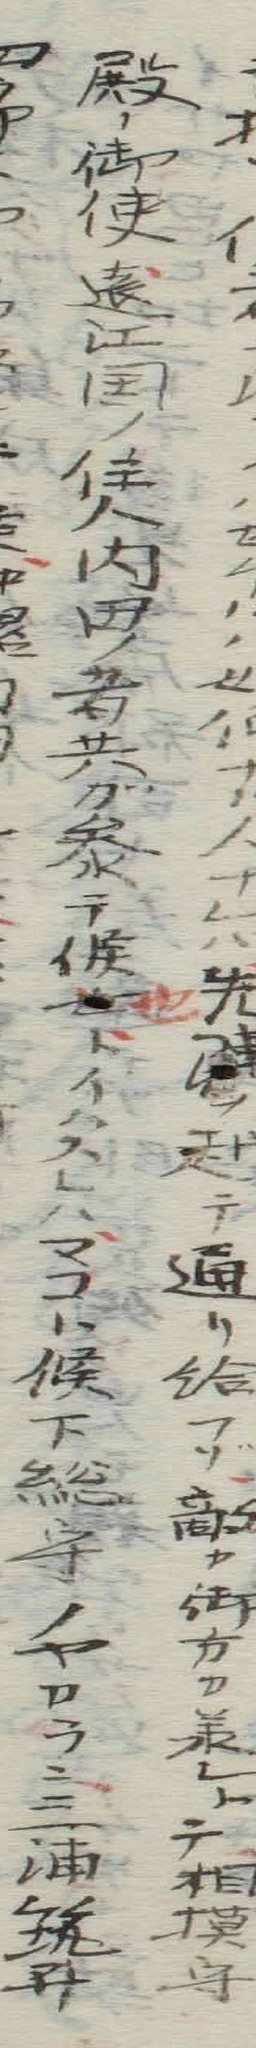殿ノ御使、遠江国ノ住人内田ノ者共ガ参テ候也、トイハスレハ、マコト候下総守ノヤカラニ三浦筑井
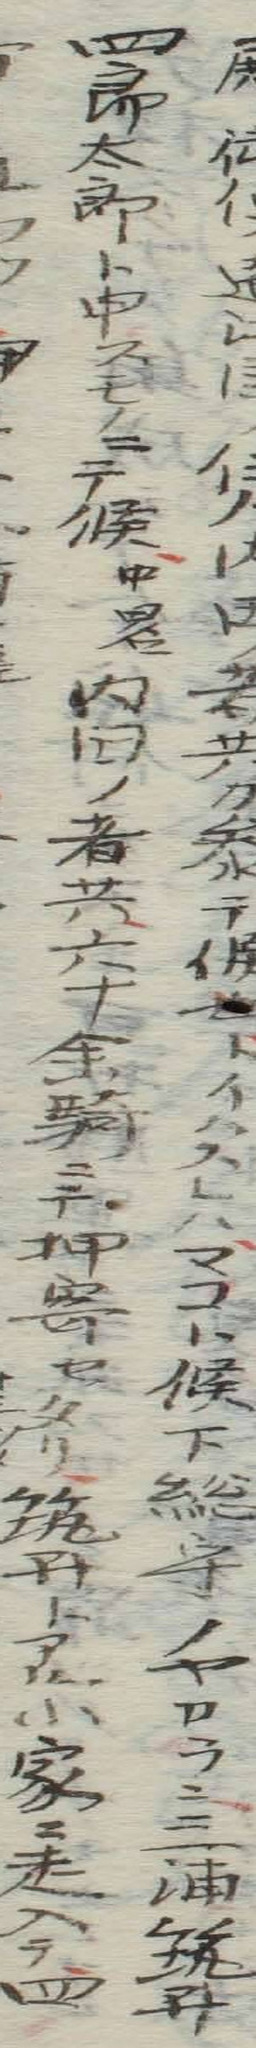四郎太郎ト申スモノニテ候、中略内田ノ者共、六十余騎ニテ押寄セタリ、筑井トアル小家ニ走入テ、四

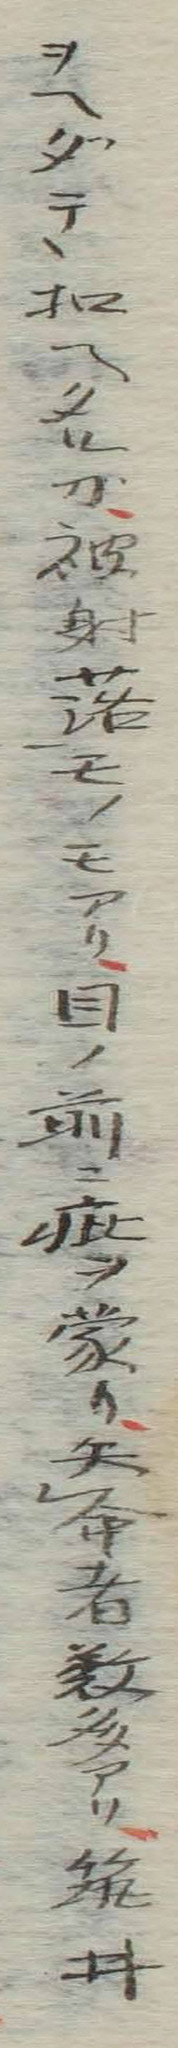ヲヘダテヽ扣ヘタルガ、被射落モノモアリ、目ノ前ニ疵ヲ蒙リ、失命者数多アリ、筑井
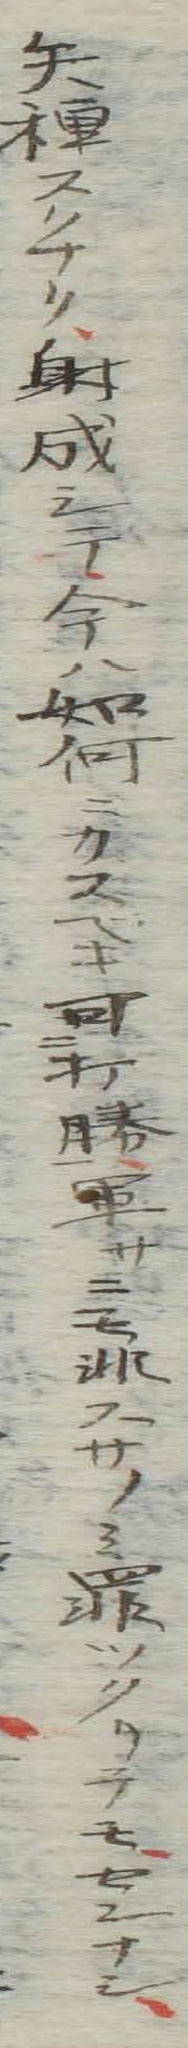矢種スクナク、射成シテ、今ハ如何ニカスベキ可打勝、軍サニモ非スサノミ罪ツクリテモ、センナシ、
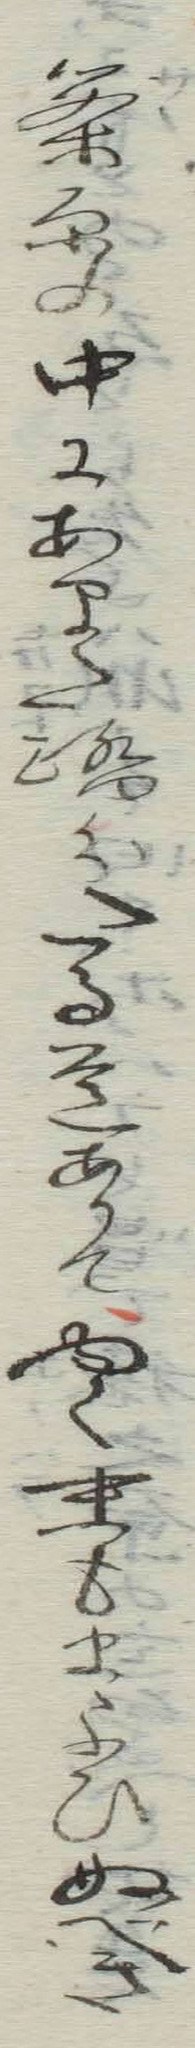筿原の中にあまた踏分たる道ありて、ゆく末もまよひぬべき
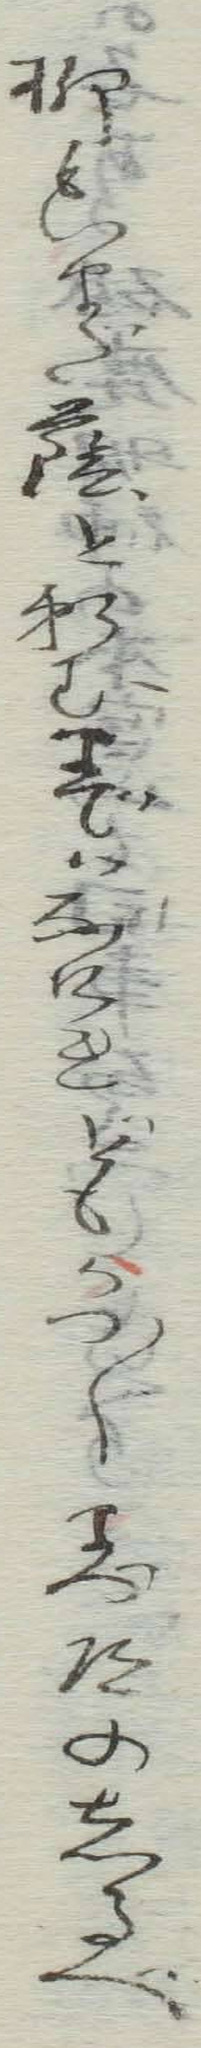柳もいまだ蔭と賴むまではなけれども、かつ〴〵まづ道のしるべ
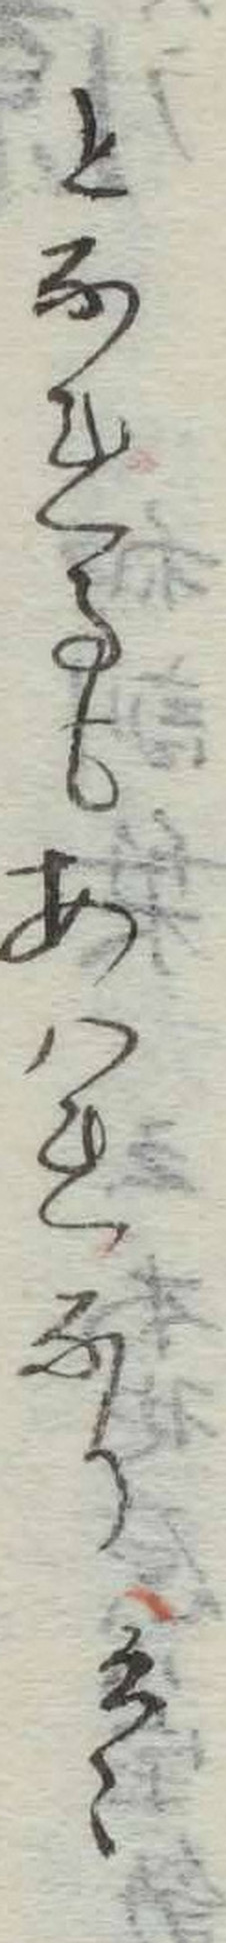となれるもあはれなり、云々
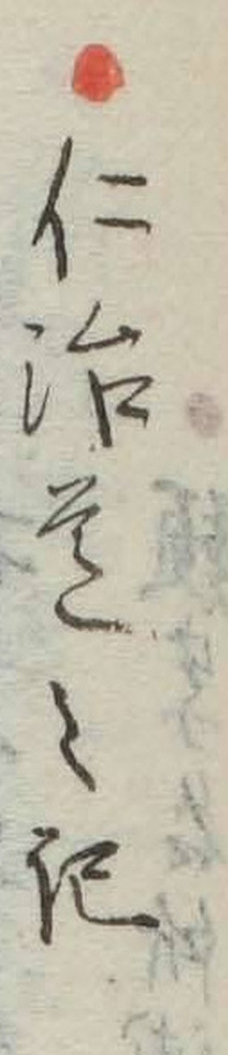●仁治道之記
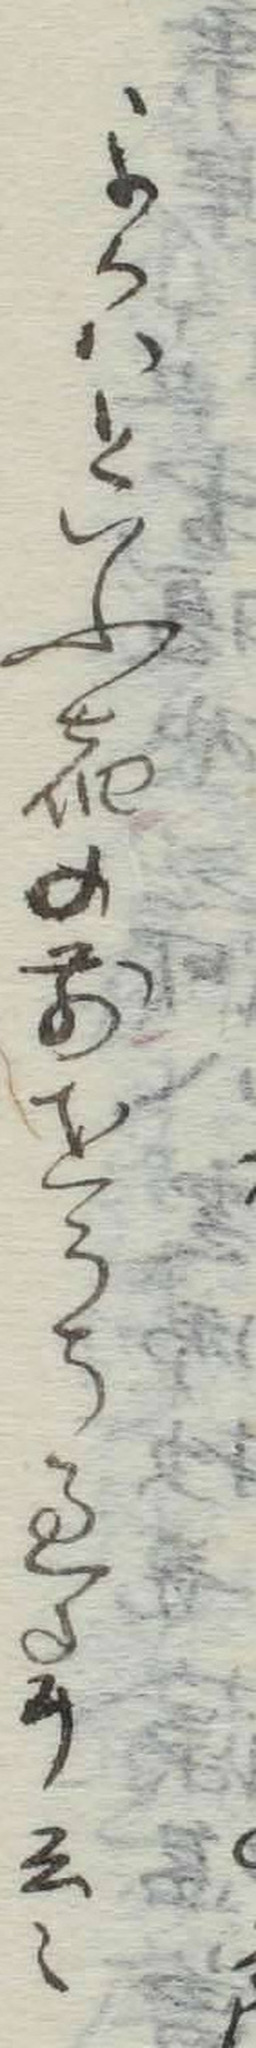よかはといふ宿の前をうち過るに云々
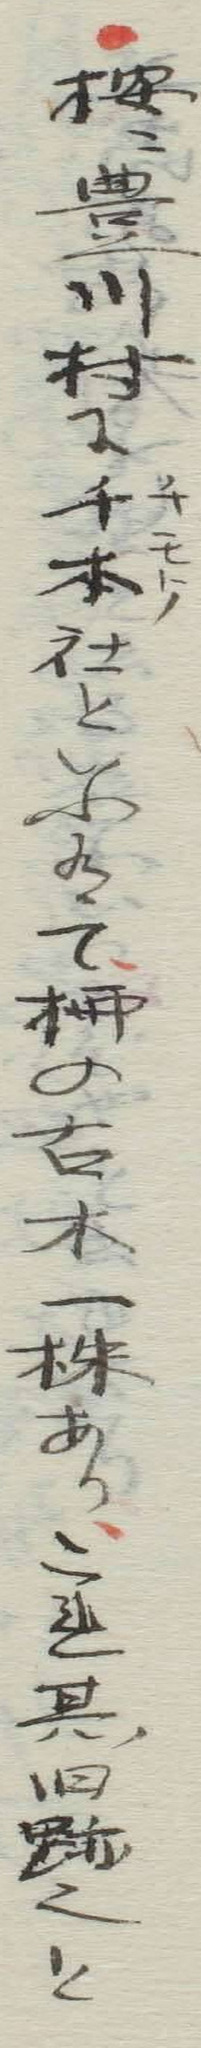●按ニ豊川村に千本社といふ有て、柳の古木一株あり、これ其旧跡也と
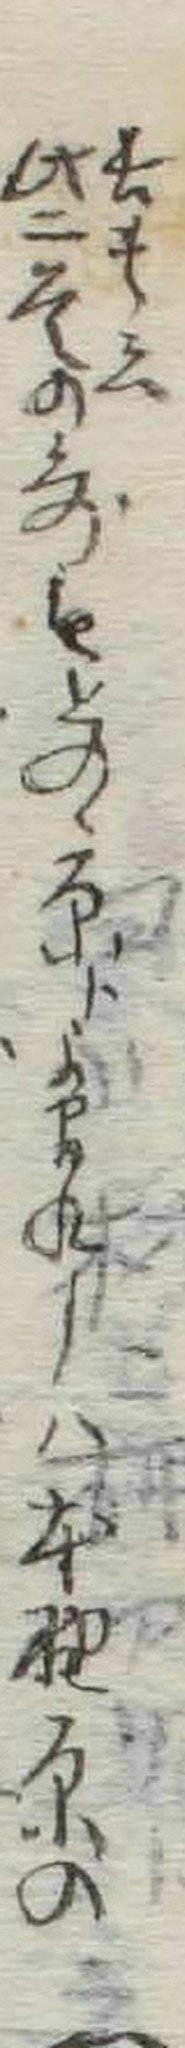此二首の歌もとのゝ原トよまれしは本野原の
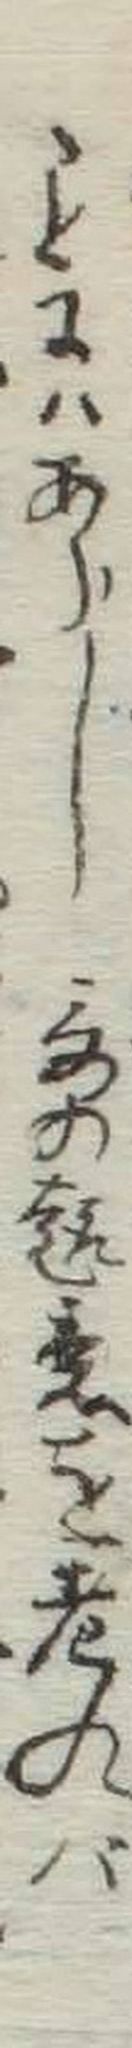ことにはあらじ歌の趣意を考れば
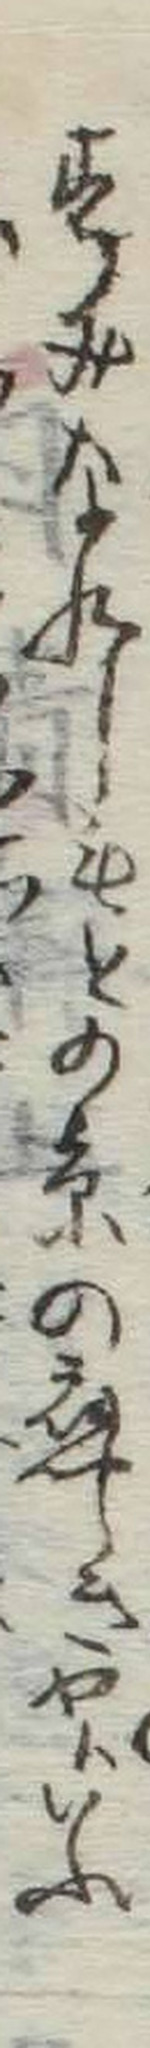すみなれしもとの原の恋しきやトいふ
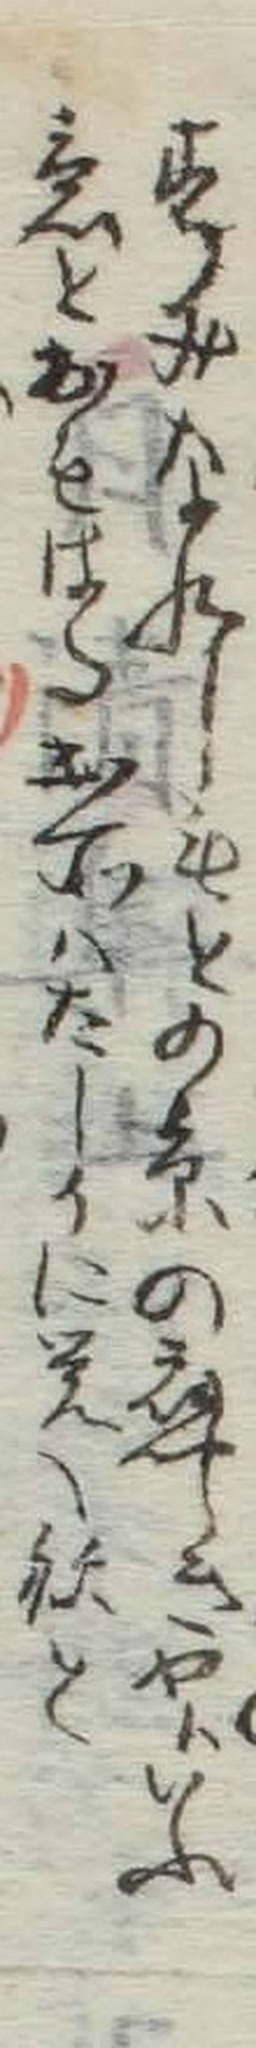意とおもはる出所はたしかに覚へねと
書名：三河国古跡考
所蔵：国文学研究資料館
